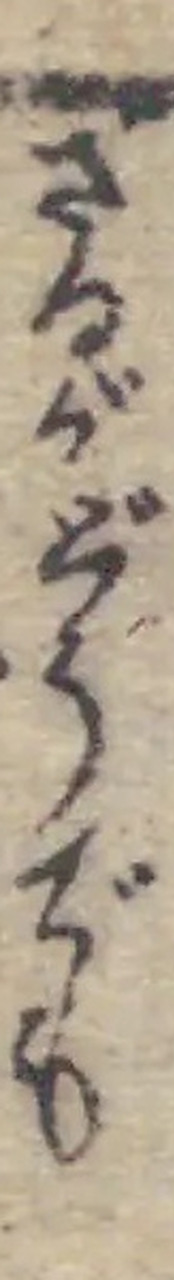さるがどうでも
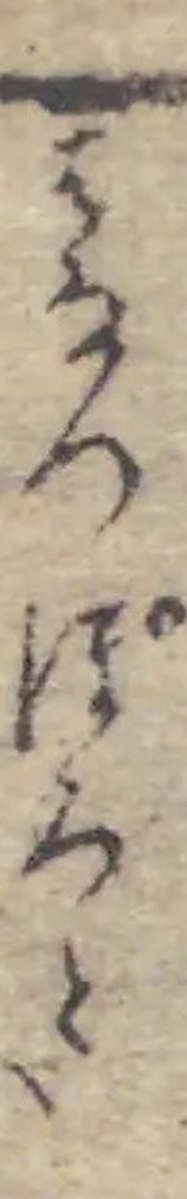はなつぽろと
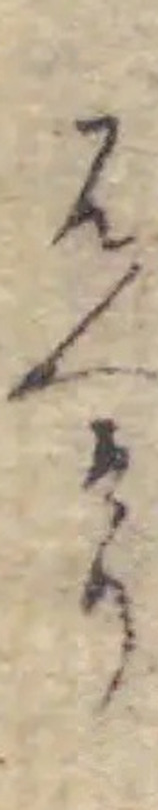見へけり

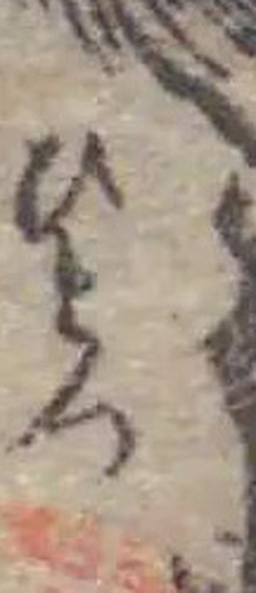ひとつ
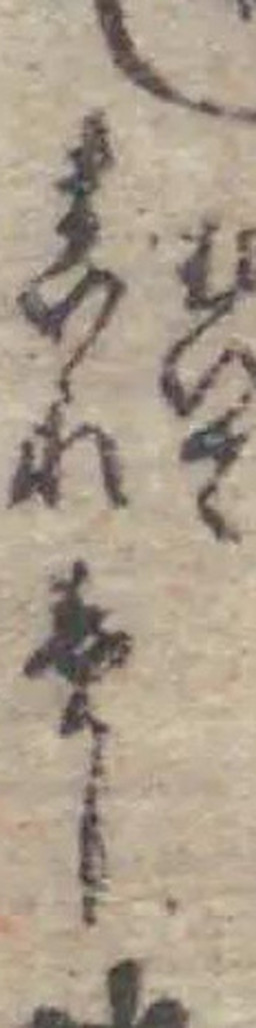まいれしかし
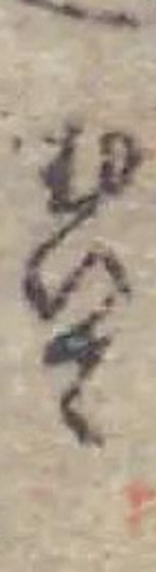むいて
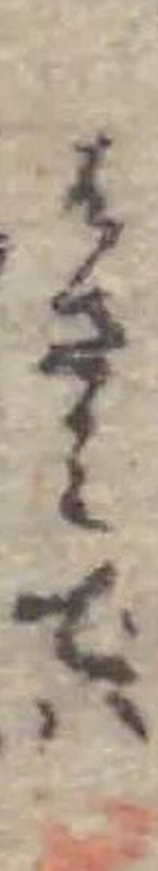はさみては
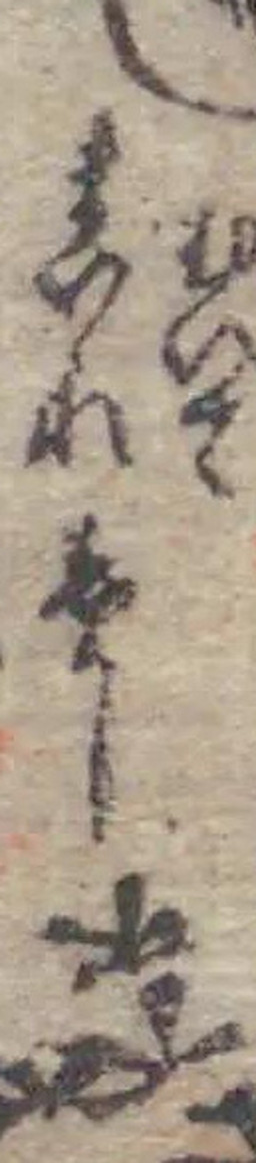まいれしかし
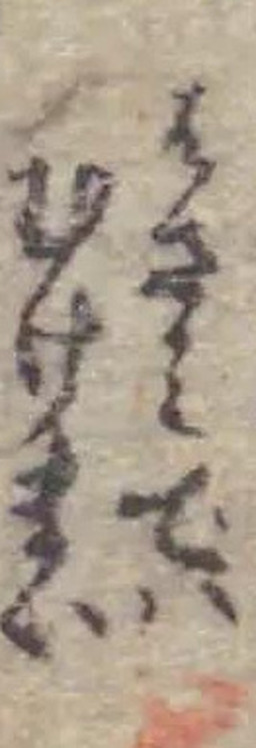むけまい
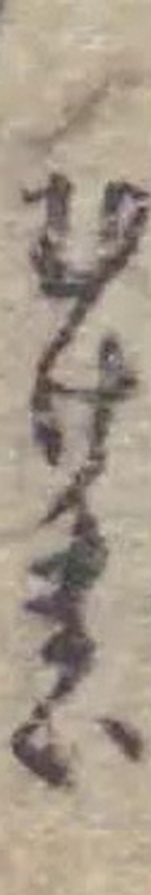むけまい
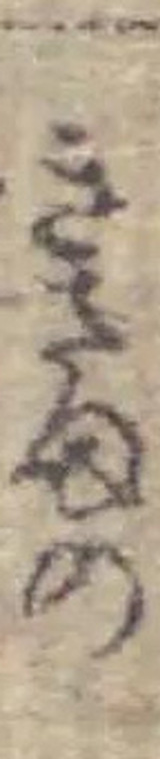きさまの
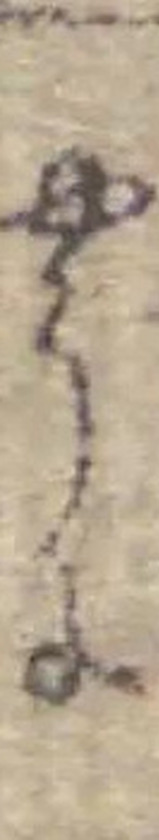やうに
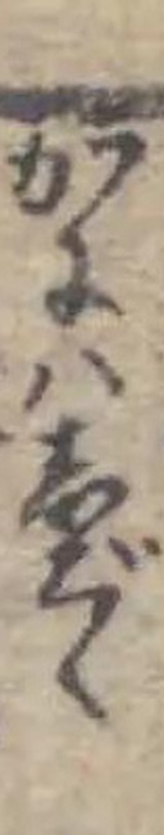かにはしごく
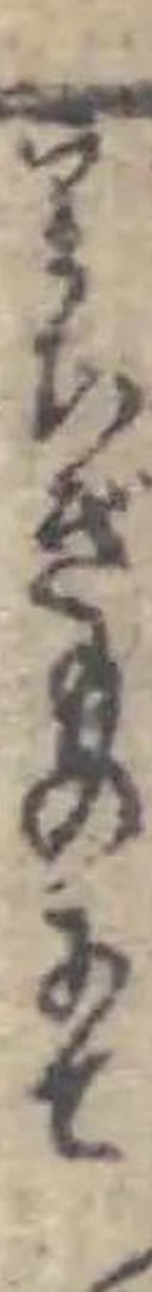りちぎものにて
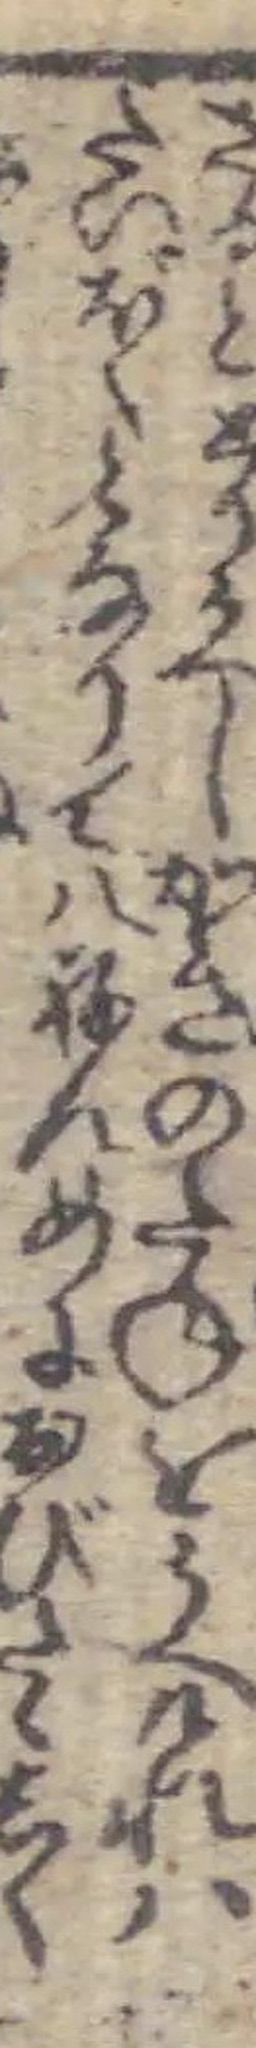たいぼくとなりて八ねんめにおびたゝしく
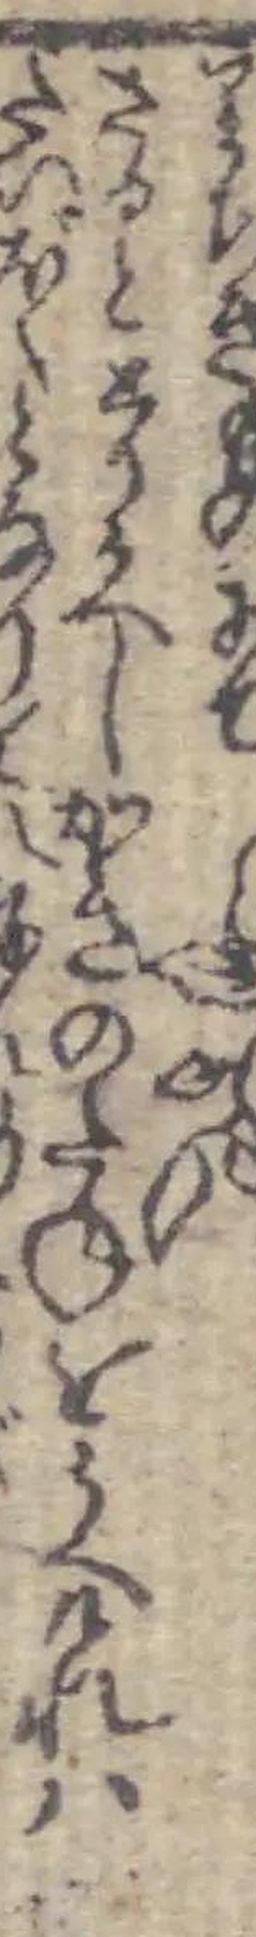さるととりかへしかきのたねをうへけれは
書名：蟹牛房挟多 3巻
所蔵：国立国会図書館 National Diet Library, JAPAN
